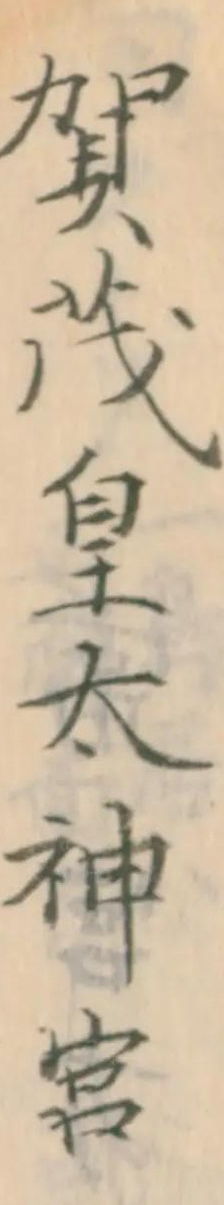賀茂皇太神宮
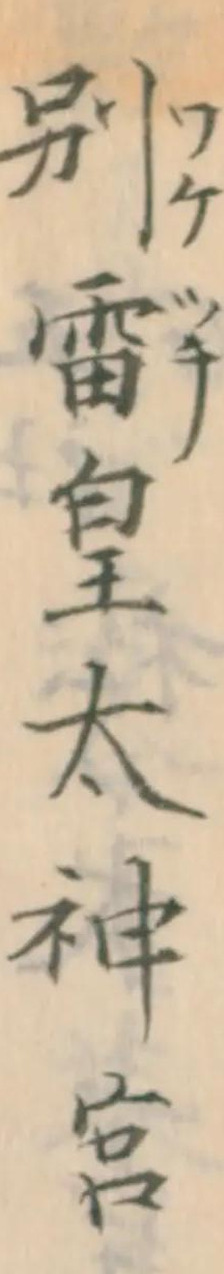別雷皇太神宮
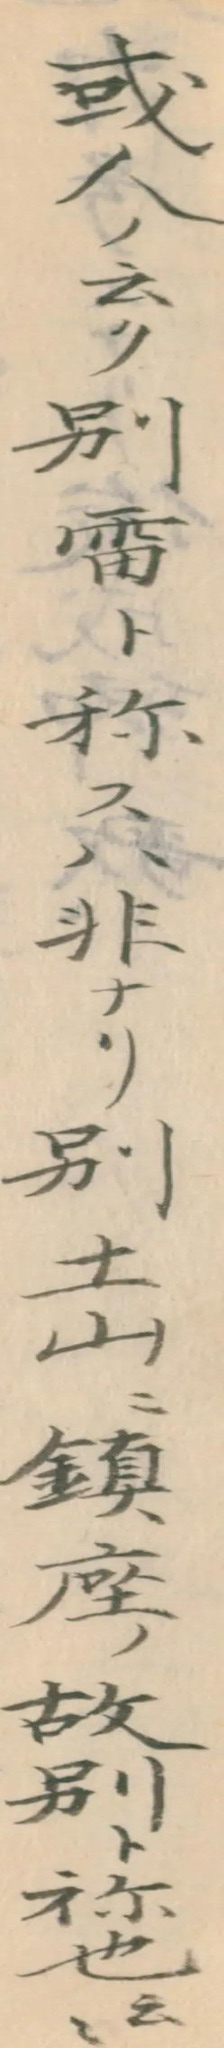或人ノ云ク別雷ト称スハ非ナリ別土山ニ鎮座ノ故別ト称也云々
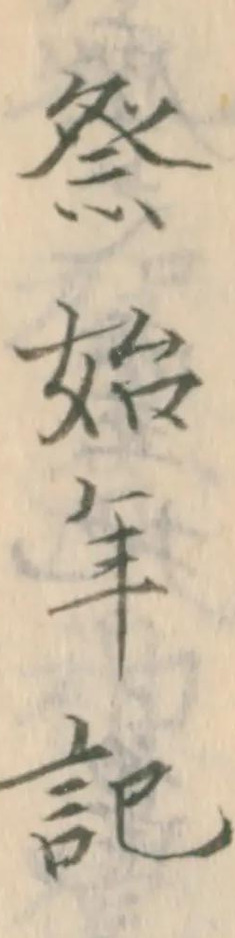祭始年記
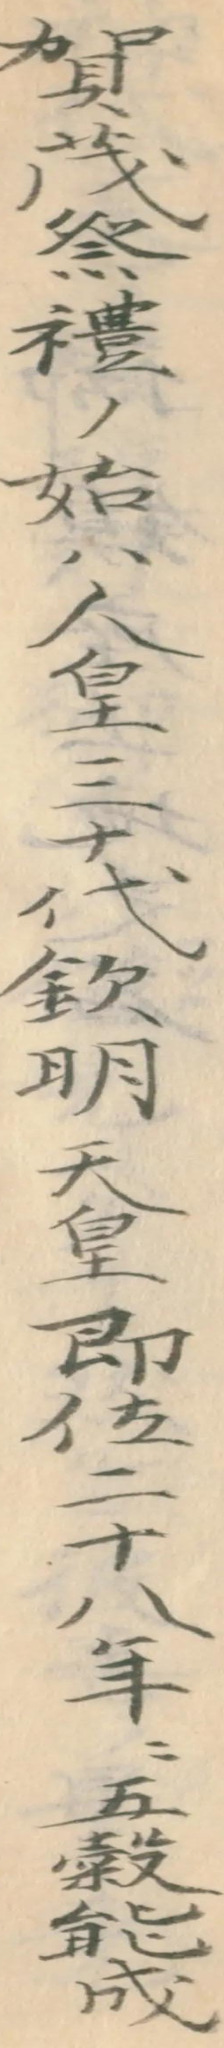賀茂祭礼ノ始ハ人皇三十代欽明天皇即位二十八年ニ五穀能成
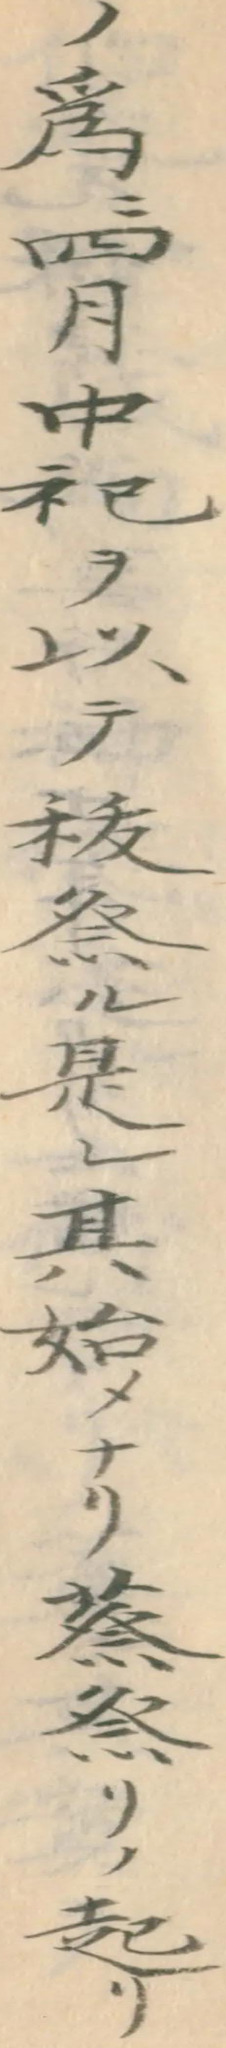ノ為ニ四月中祀ヲ以テ祓祭ル是レ其始メナリ葵祭リノ起リ
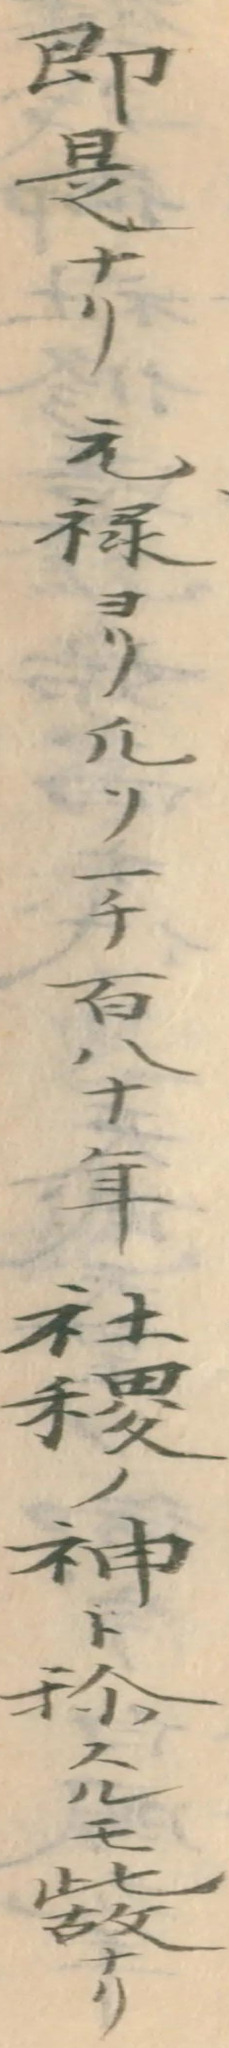即是ナリ元禄ヨリ凡ソ一千百八十年社稷ノ神ト称スルモ此故ナリ
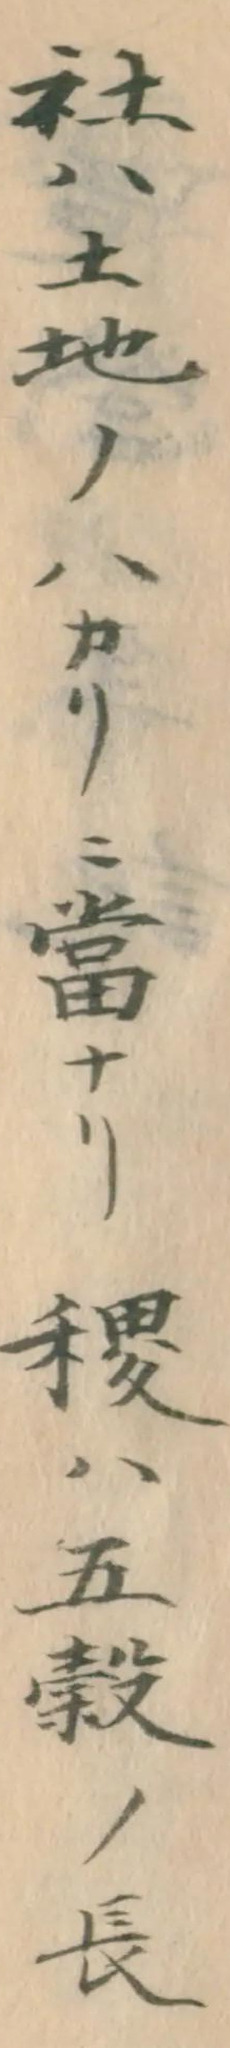社ハ土地ノハカリニ当ナリ稷は五穀ノ長

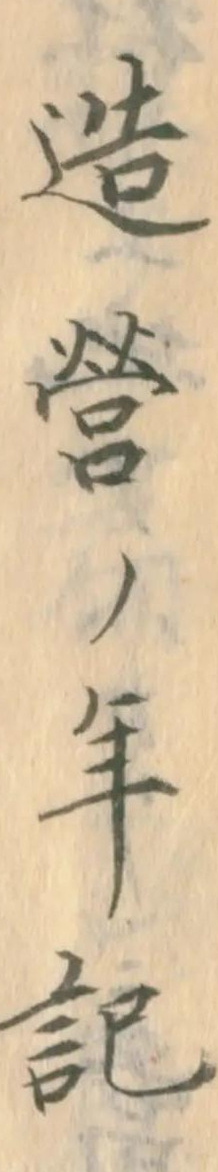造営ノ年記
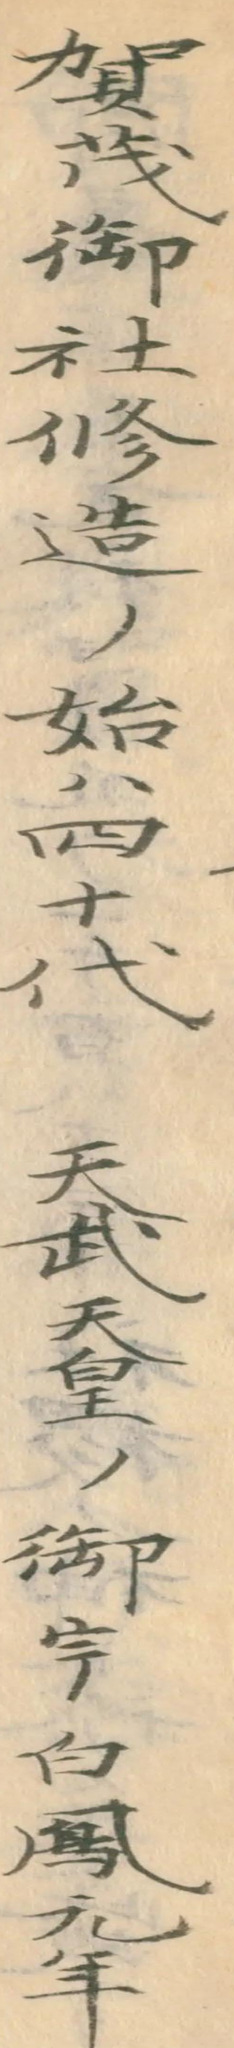賀茂御社修造ノ始ハ四十代天武天皇ノ御宇白鳳九年
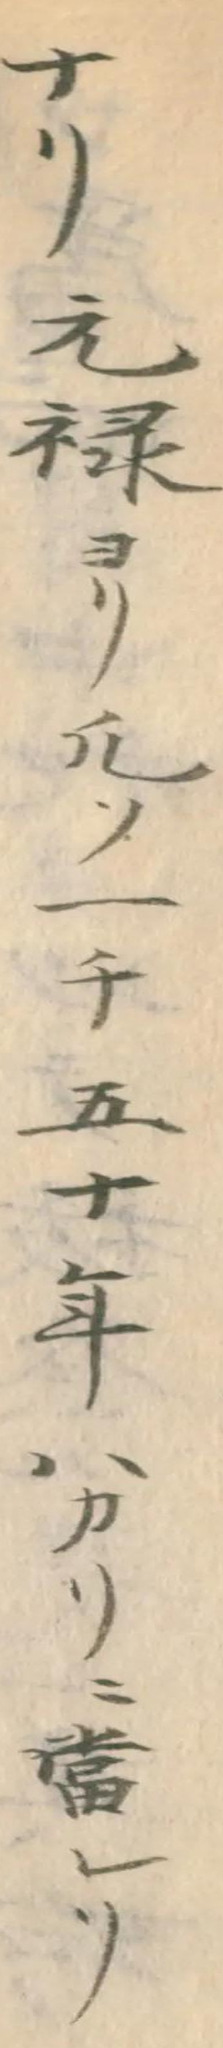ナリ元禄ヨリ凡ソ一千五十年ハカリニ当レリ
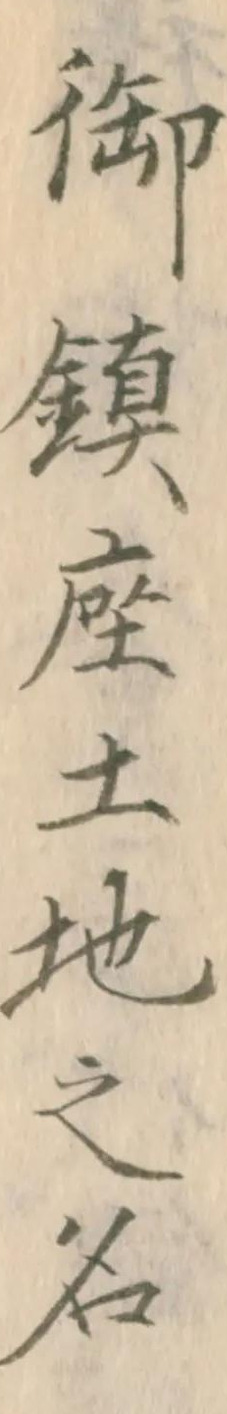御鎮座土地之名
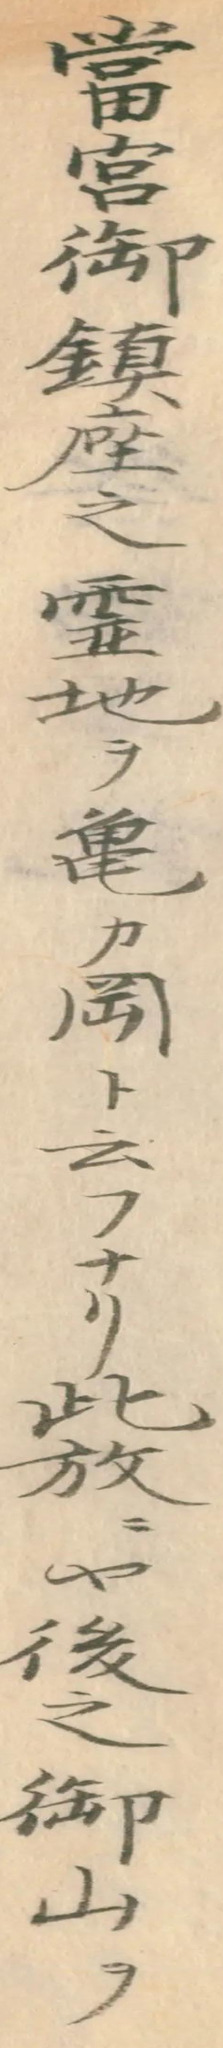当宮御鎮座之霊地ヲ亀カ岡ト云フナリ此放ニヤ後之御山ヲ
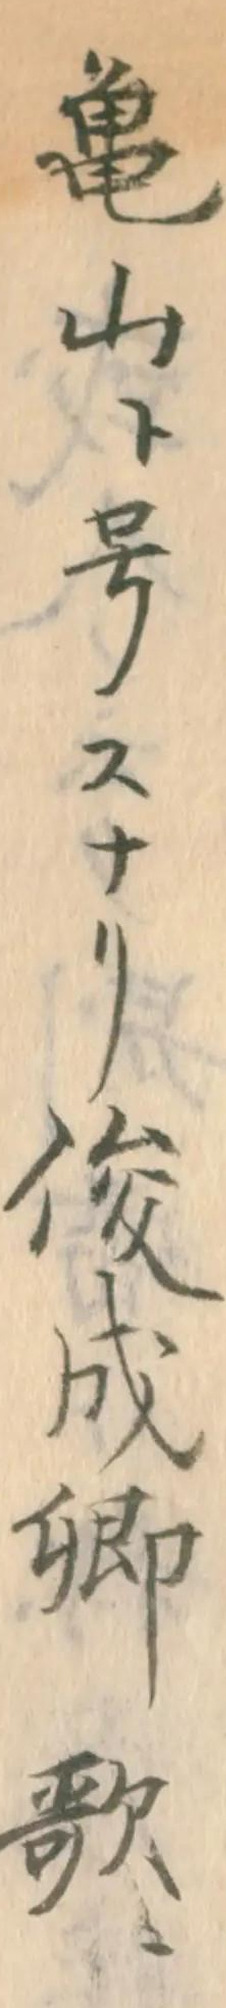亀山ト号スナリ俊成卿歌ニ
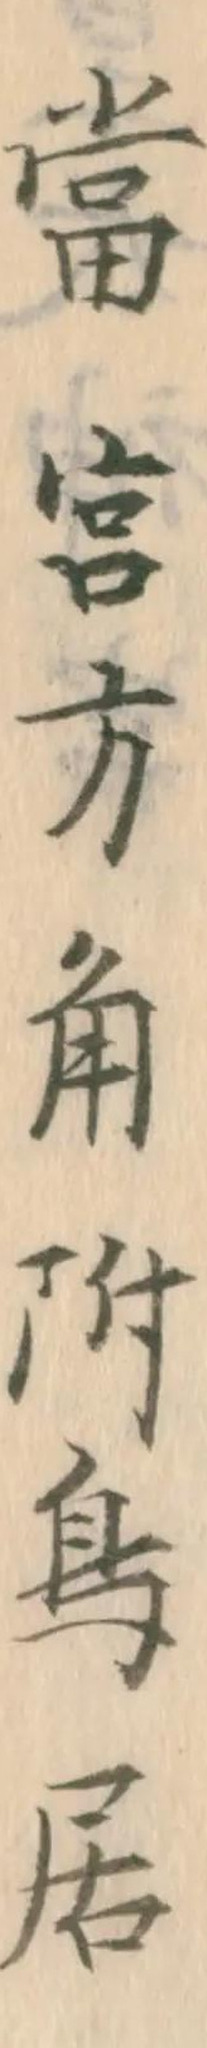当宮方角附鳥居
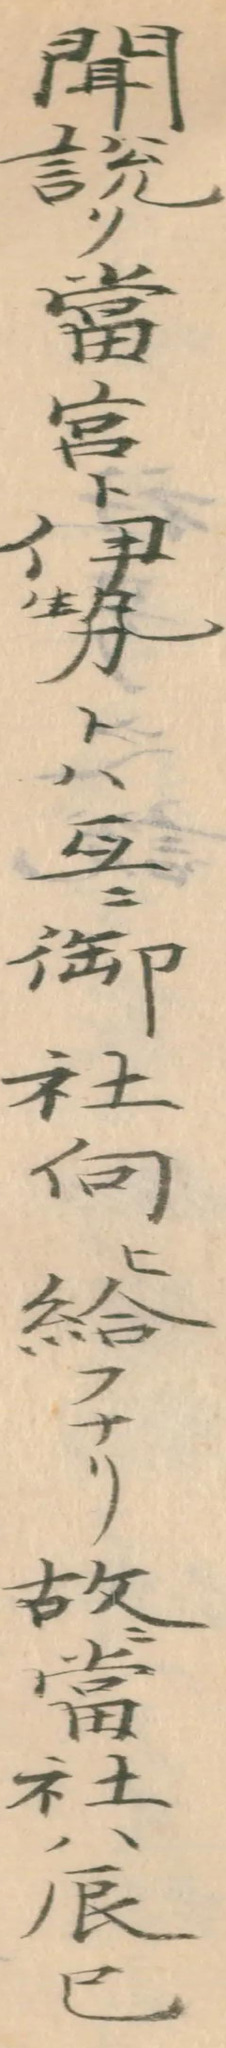聞説ク当宮ト伊勢トハ互ニ御社向ヒ給フナリ故ニ当社ハ辰巳
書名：賀茂社記録. 第91冊
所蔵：国立国会図書館 National Diet Library, JAPAN
